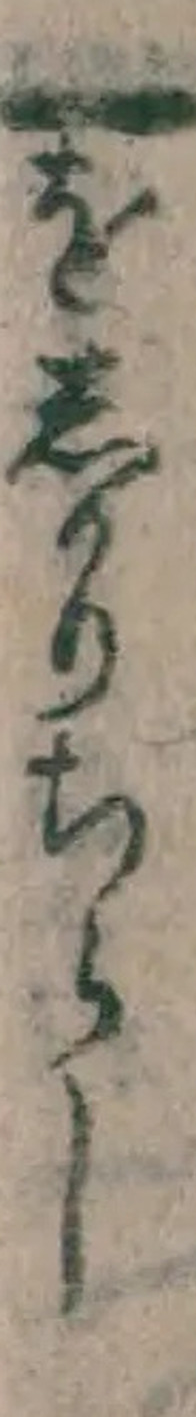をしかりちらし
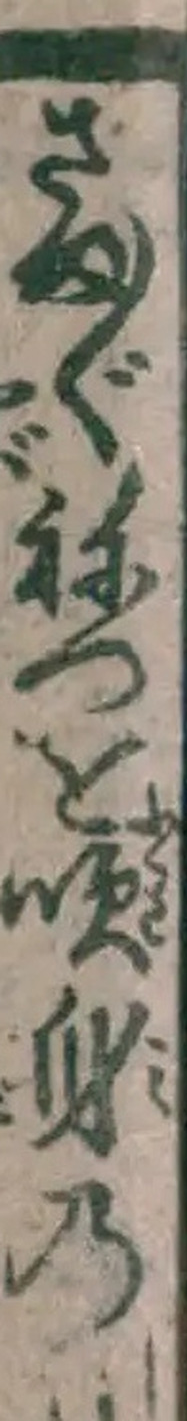さま〴〵ねつを吹身の
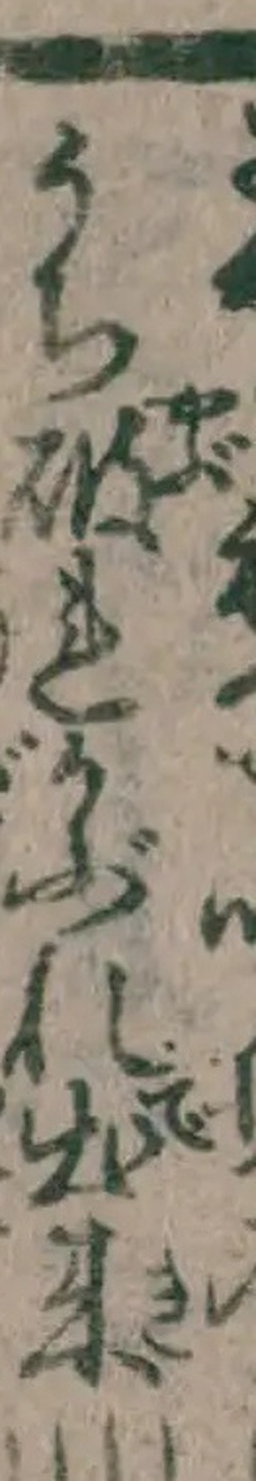うち破れかぶれ出来
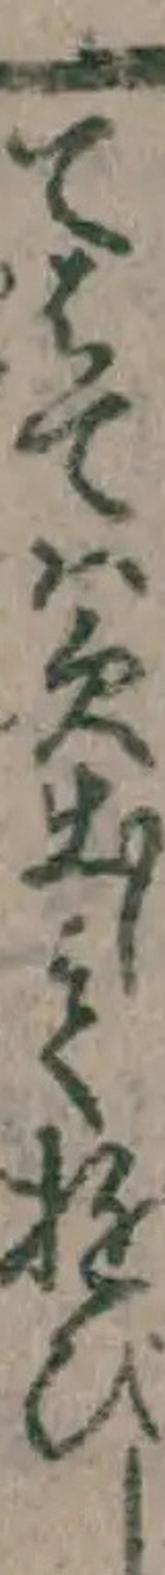てはては欠出して遊び
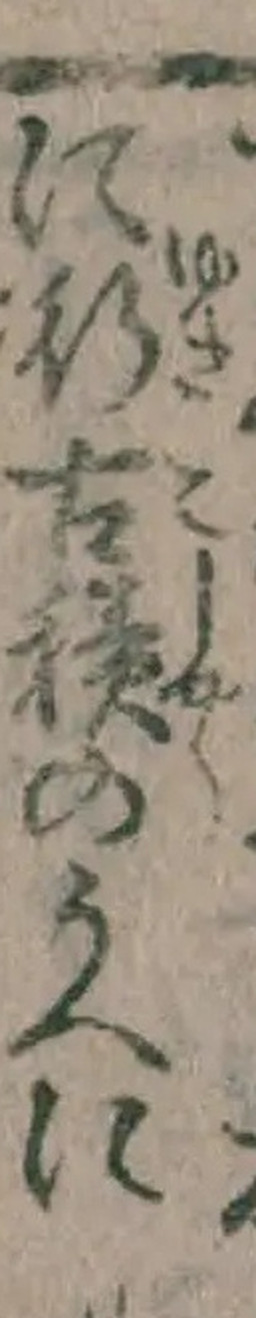に行古積のうへに
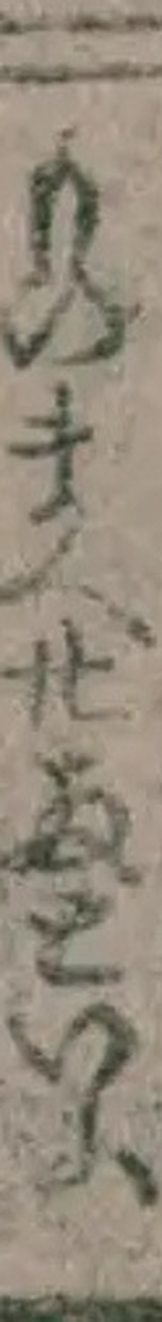ものまへ二十両といふ
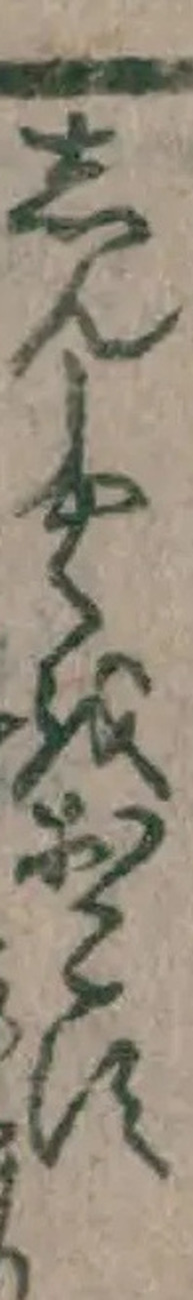しんしやくをおこす
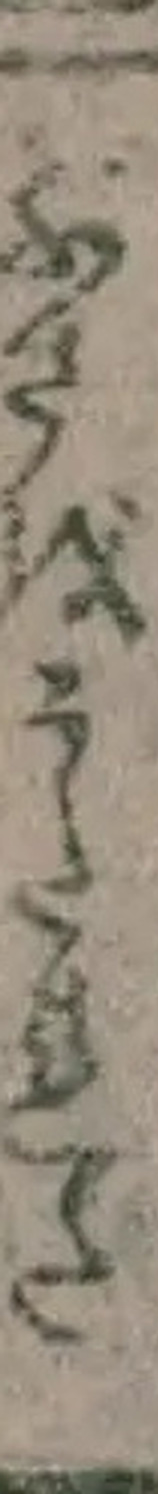ふさをうたれた
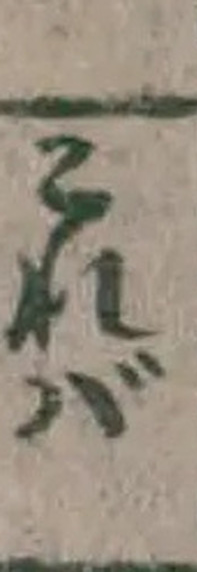これば
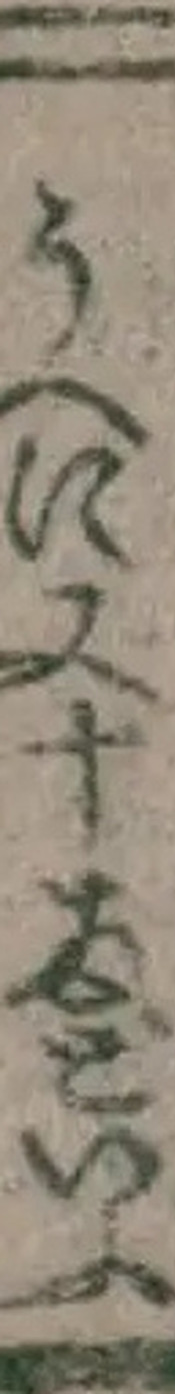うへに又十両といふ
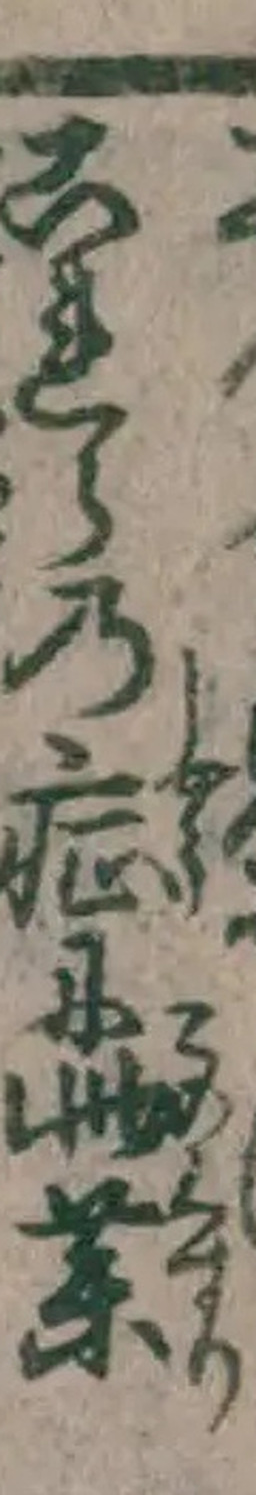これらの症に此薬
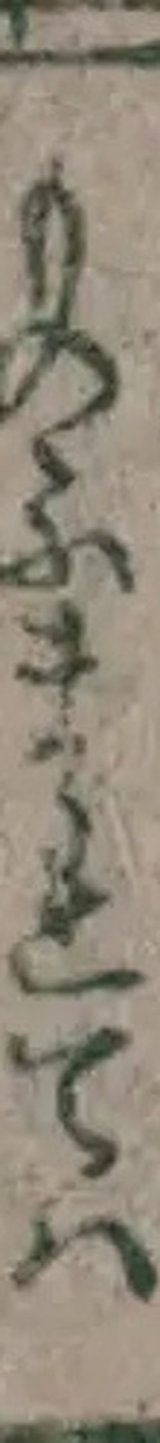ものふまれては
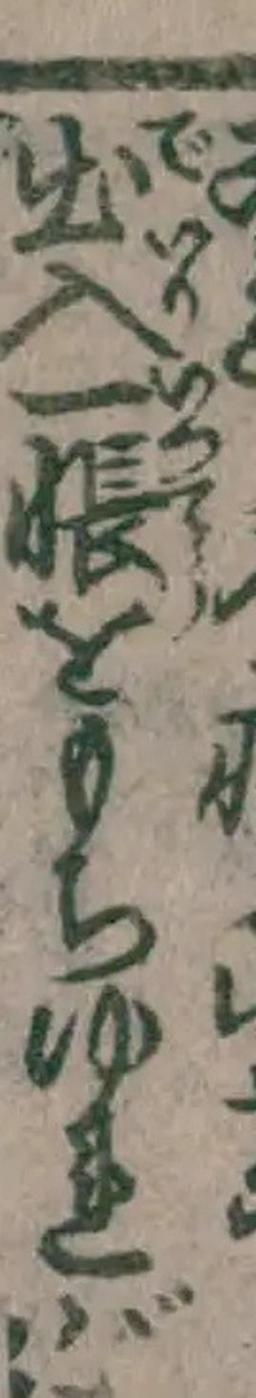出入一張をもちゆれば
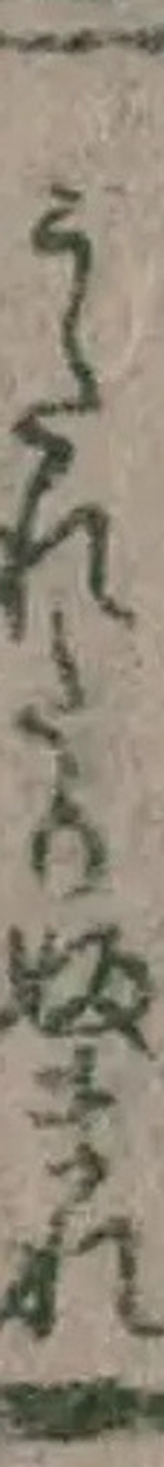うたれたりふまれ
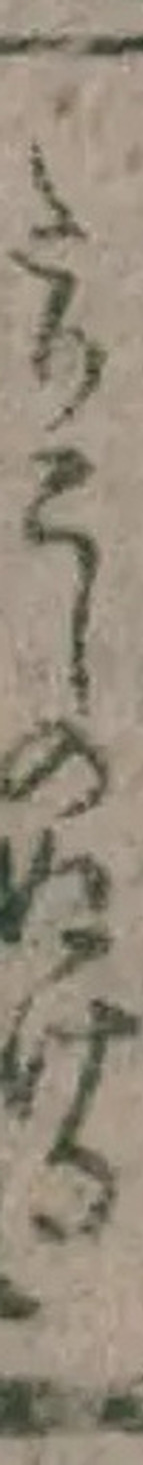たりこしのぬけるも
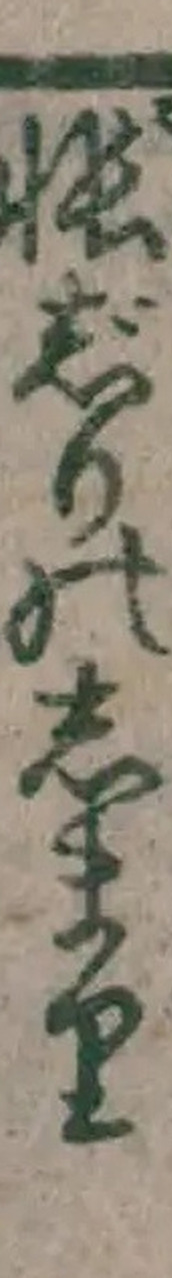帳じりのしまり
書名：視薬霞報条 3巻
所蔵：国立国会図書館 National Diet Library, JAPAN
